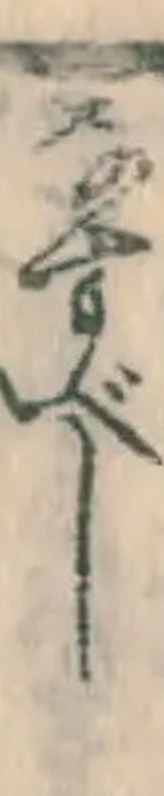なすべし
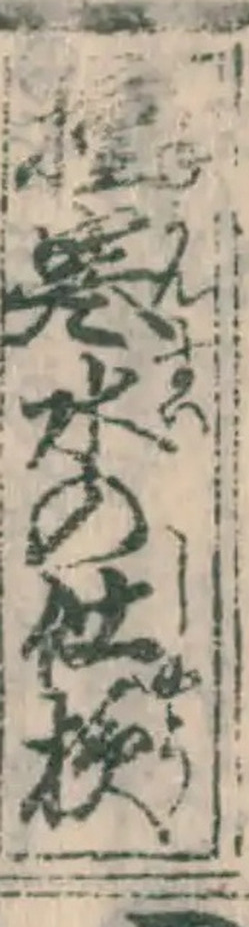種寒水の仕様
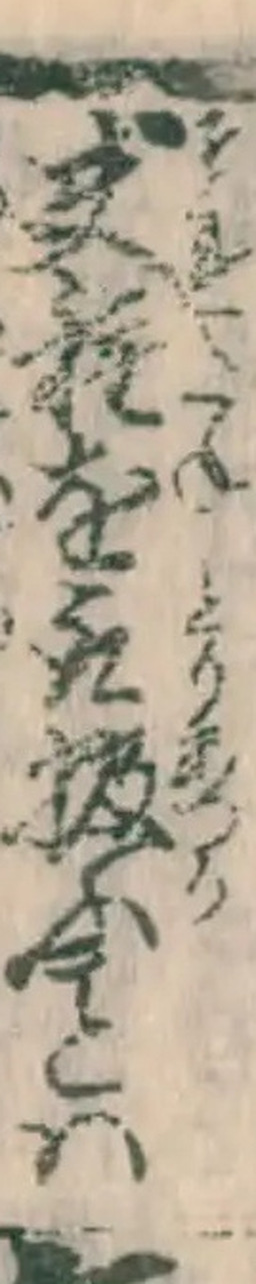夫種を取扱ふことは
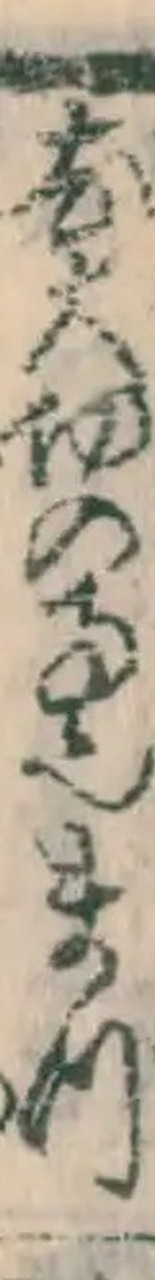尤大切の事也まづ
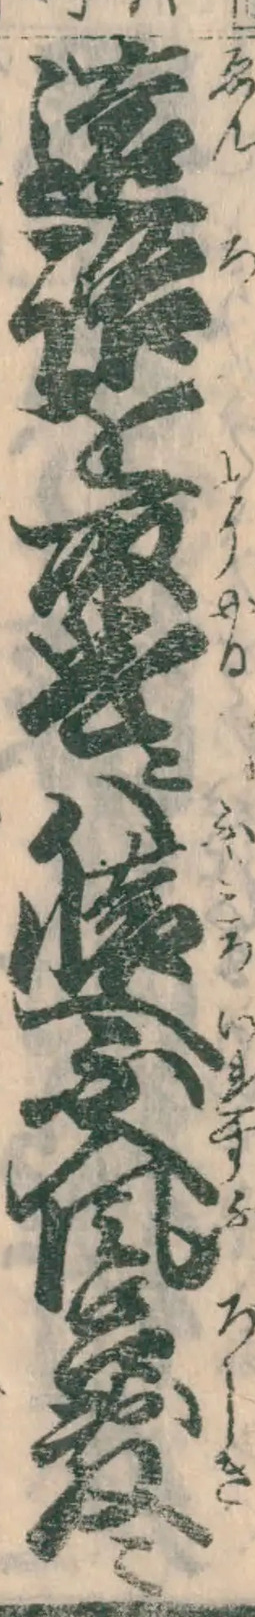遠路を取遣には懐へ不入風呂敷に
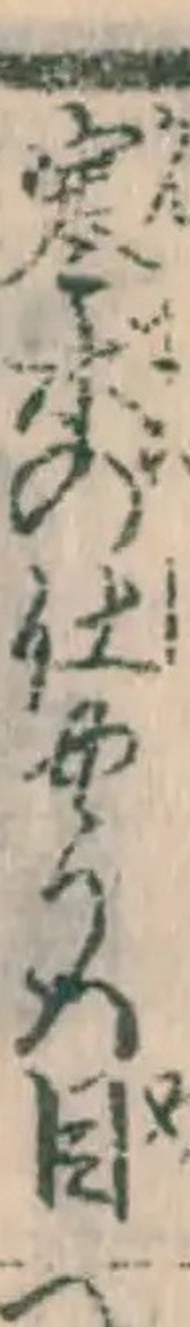完遂の仕やうは目
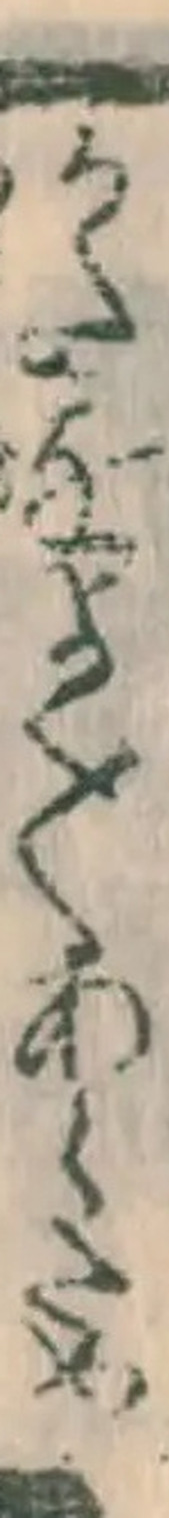かたをよく〳〵あらため
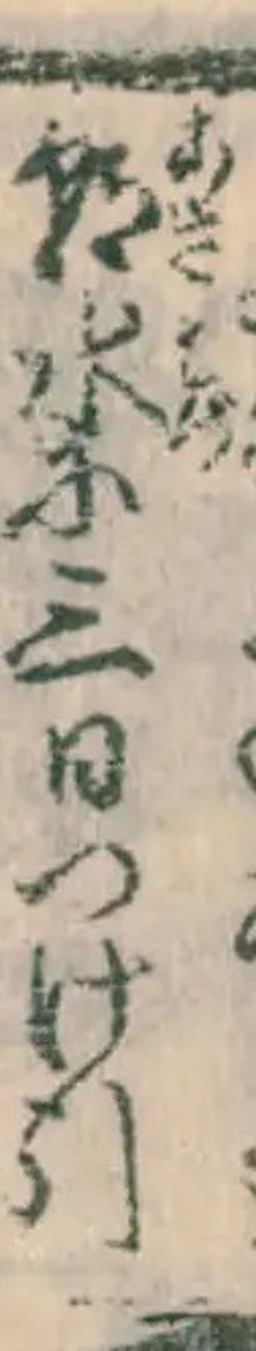朝水に三日つけ引
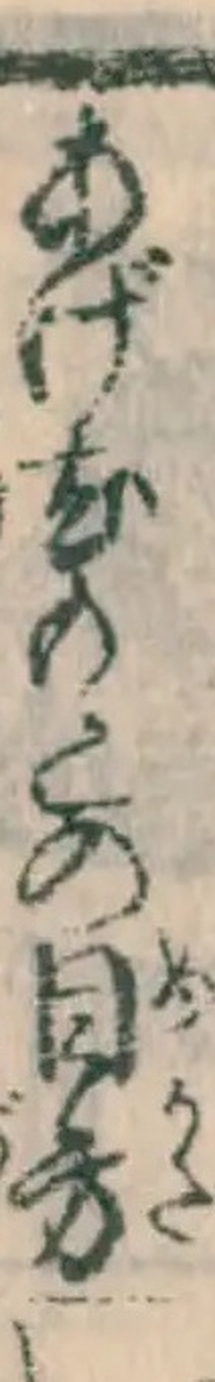あげ尤もとの目方
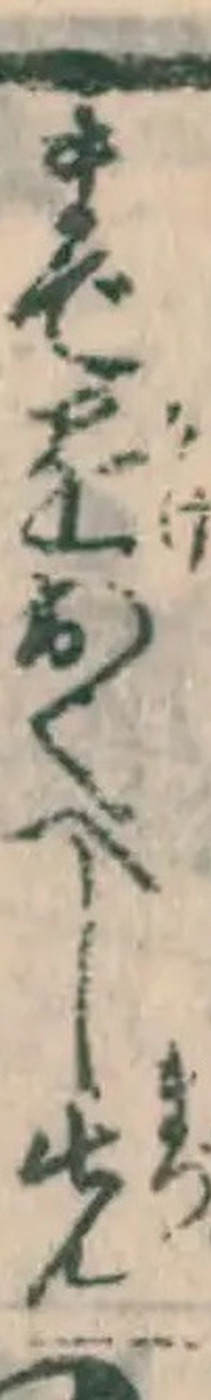まで懸おくべし先
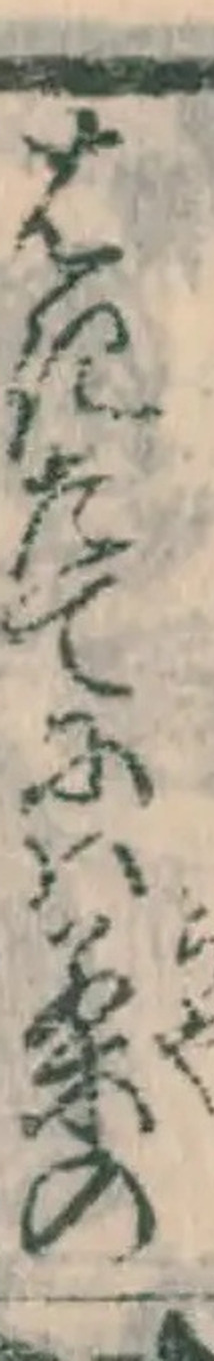はきたてには茶の
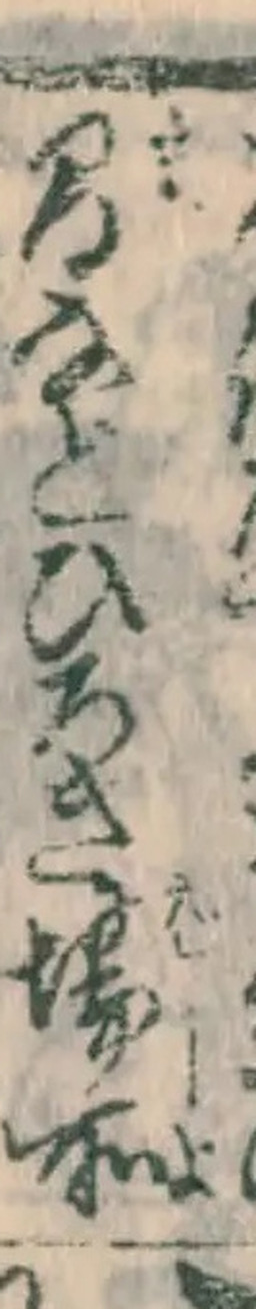間などひろき場所
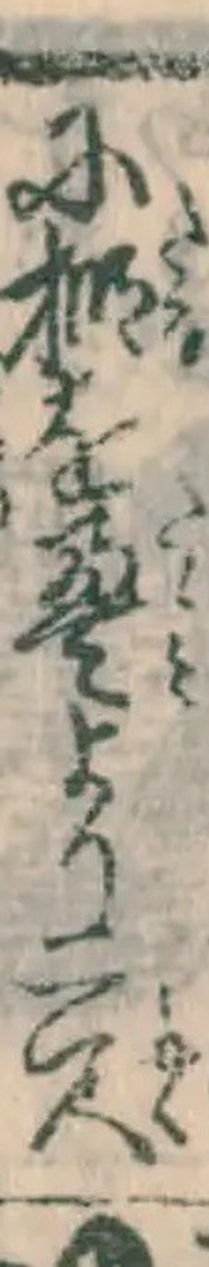に棚を畳より二尺
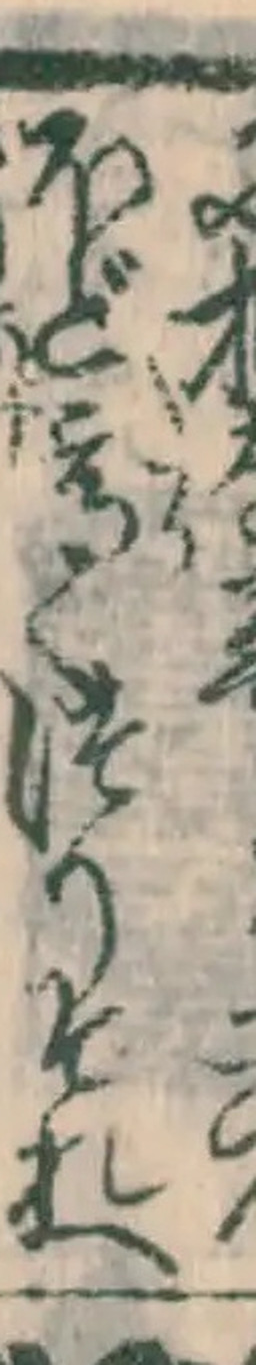ほど高くつりそれへ
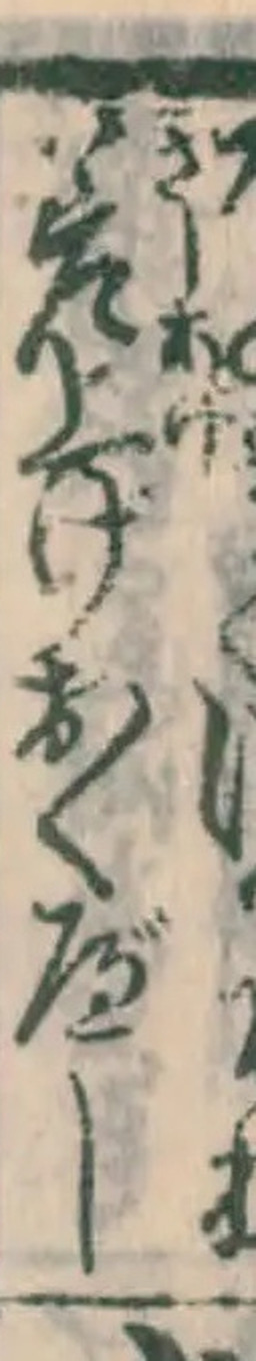差上げおくべし
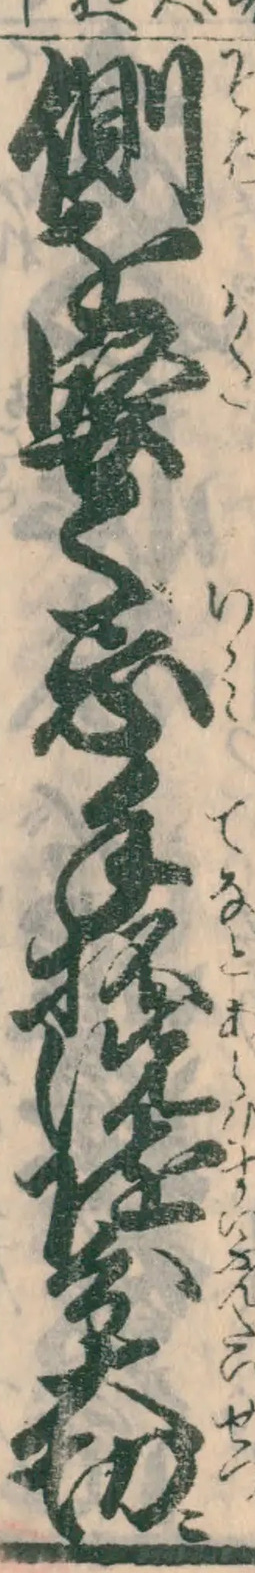側を堅く忌手抔洗随分大切に
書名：養蚕往来
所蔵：国立国会図書館 National Diet Library, JAPAN
